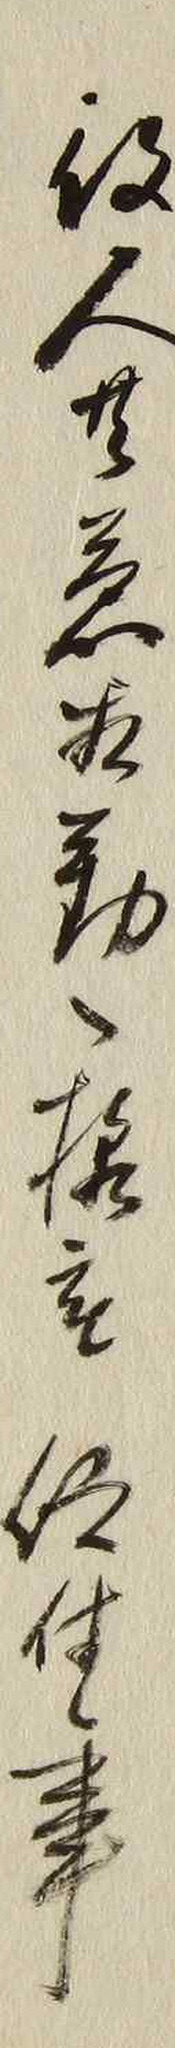役人共兼相勤候様被仰付候事
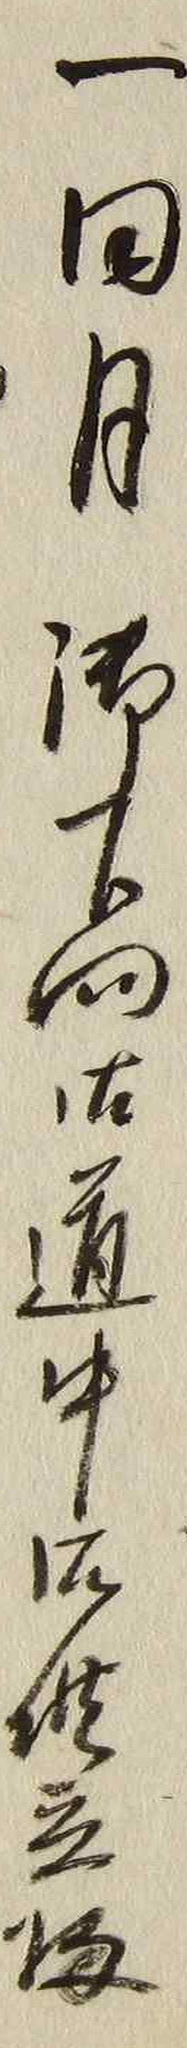一同月御下向御道中御供立帰
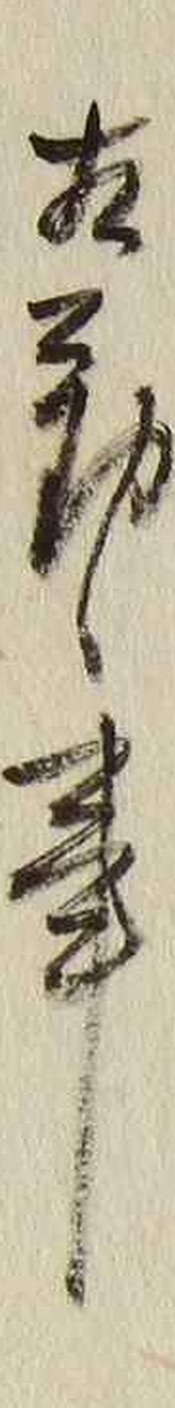相勤候事
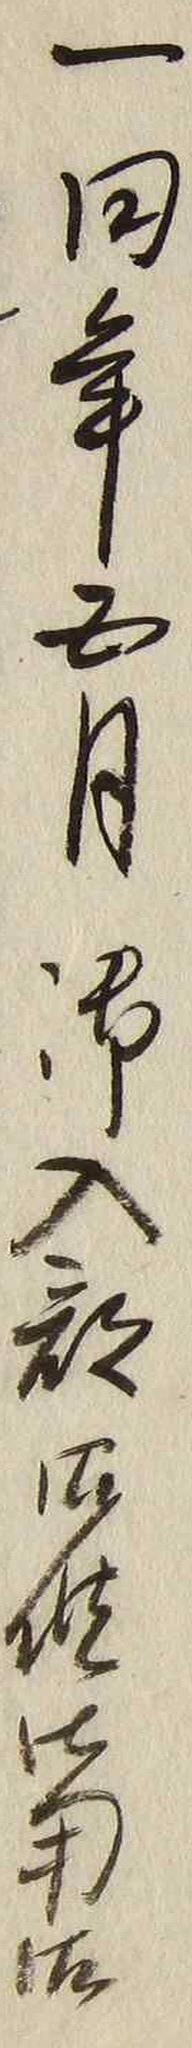一同年五月御入部御供御用御
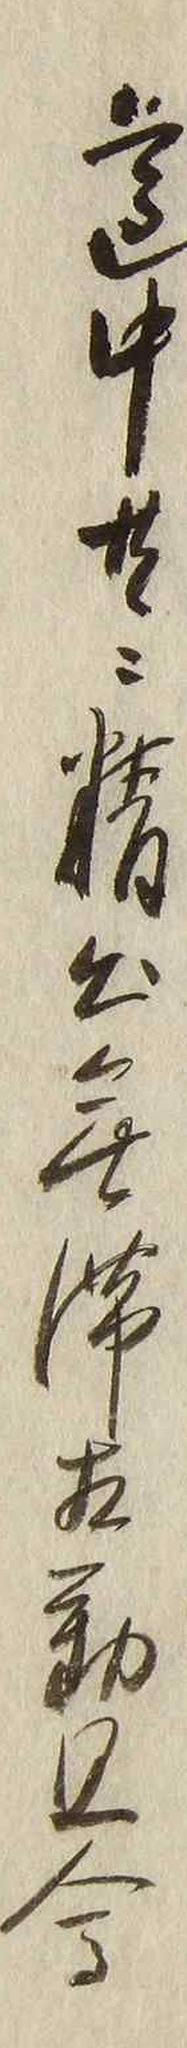道中共ニ精出無滞相勤且人馬

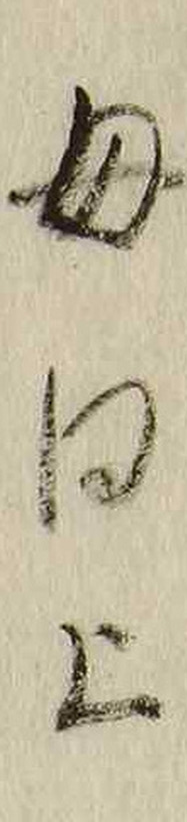母同上
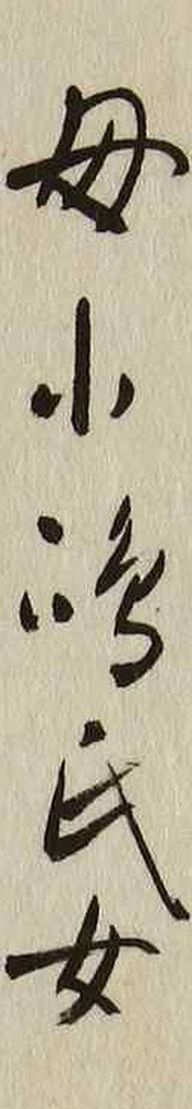母小島氏女
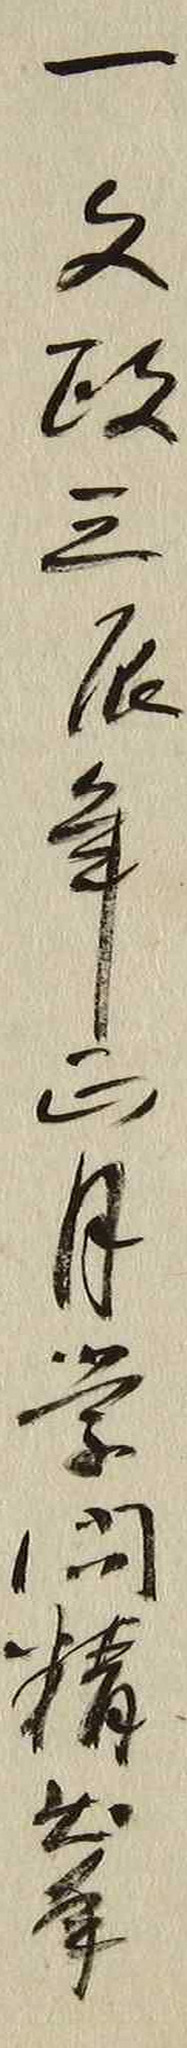一文政三辰年正月学問精出年
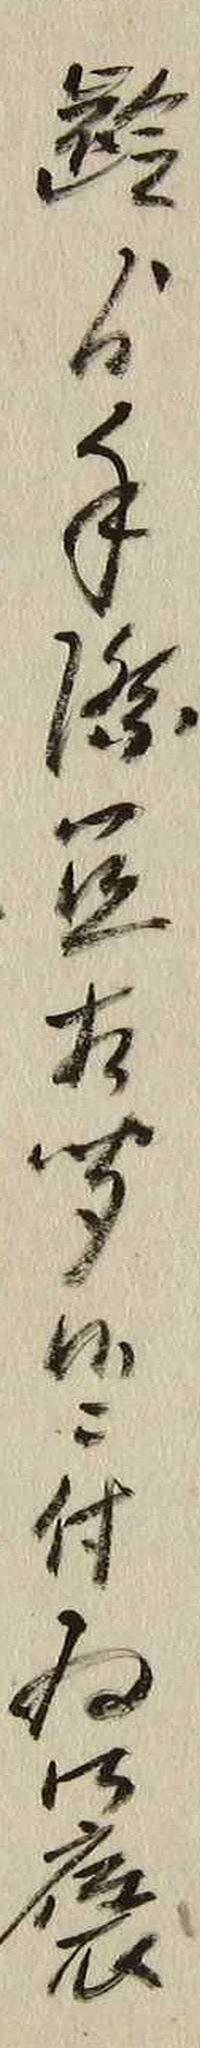齢ゟ手際宜相聞候ニ付為御褒
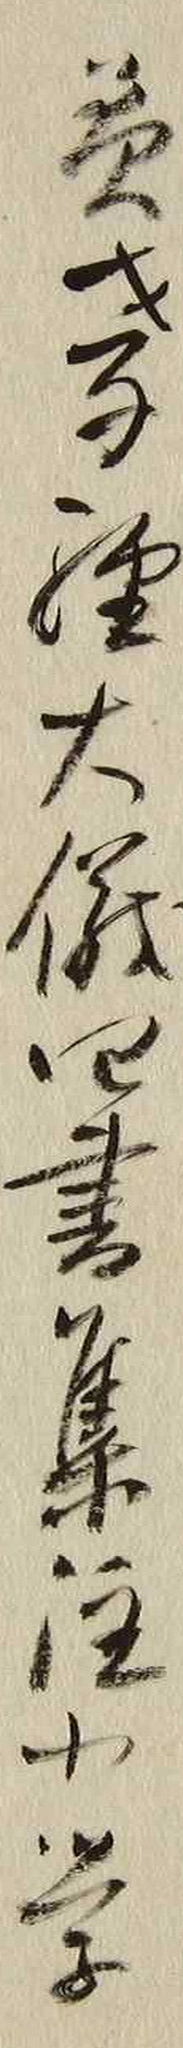美孝経大儀四書集注小学
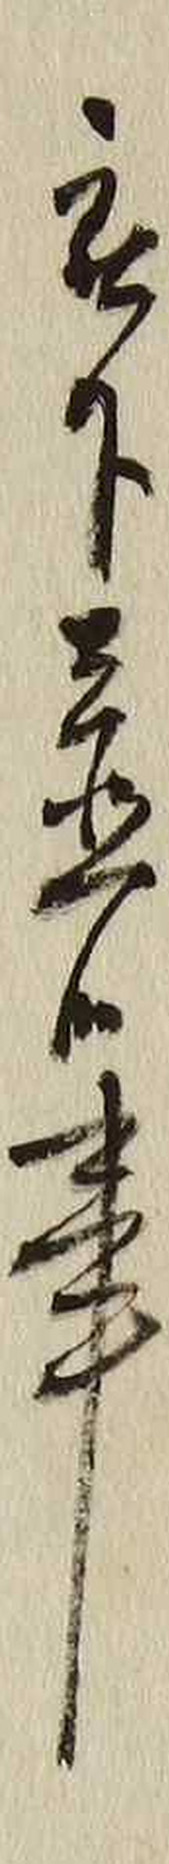被下置候事
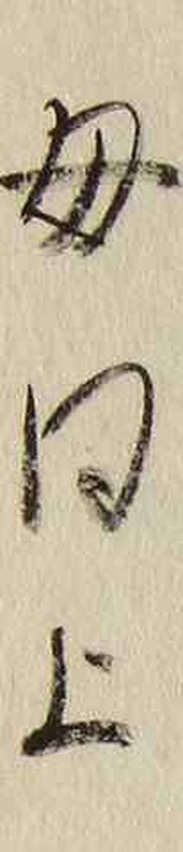母同上

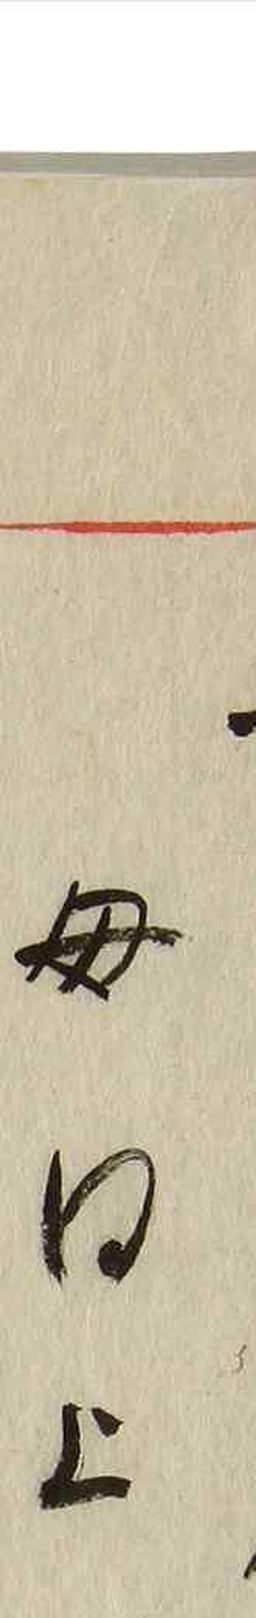母同上
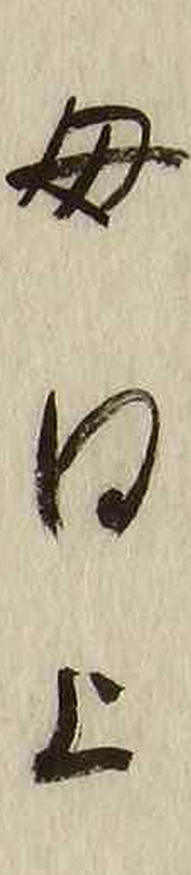母同上
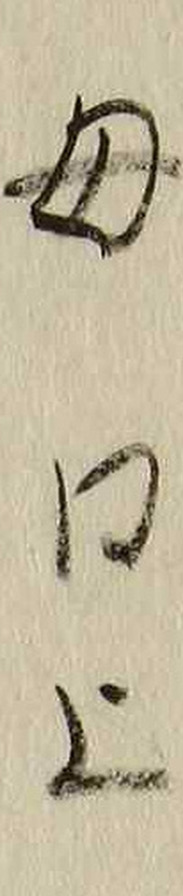母同上
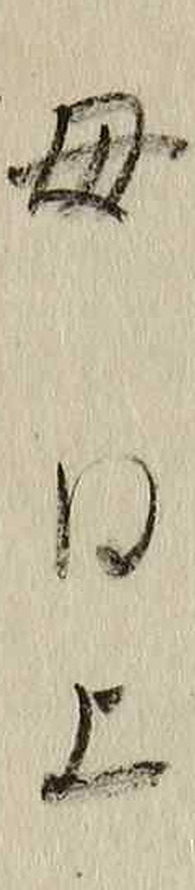母同上
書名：諸士系譜　巻之353　す之部3
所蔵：会津若松市立会津図書館
